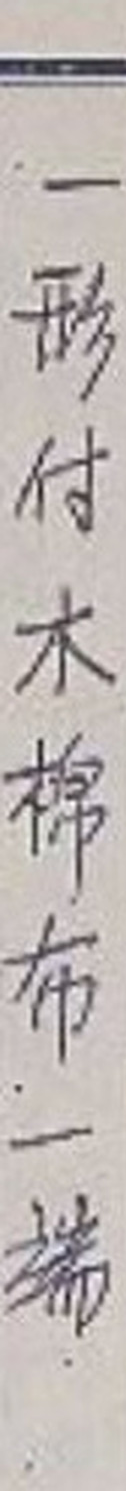一形付木棉布一端
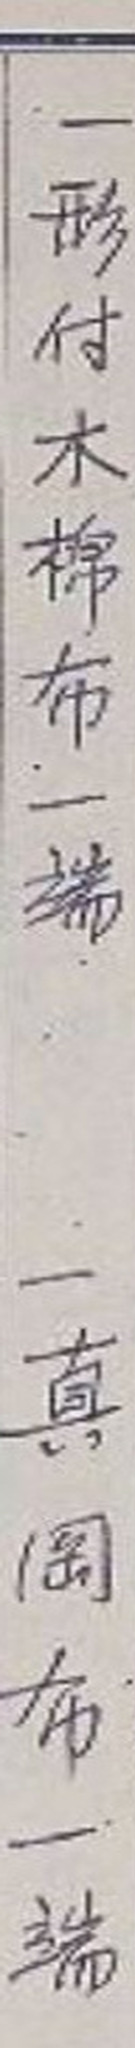一形付木棉布一端一真岡布一端
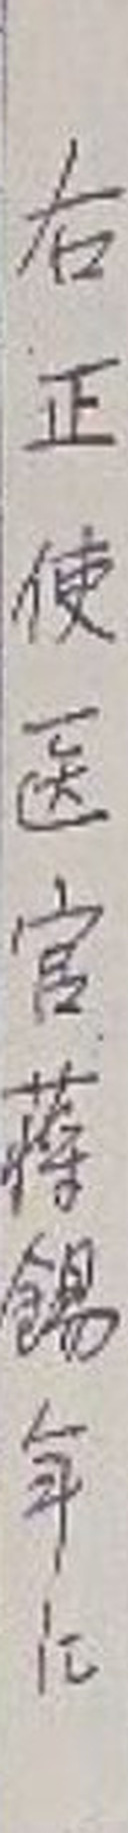右正使医官䉃錫年え
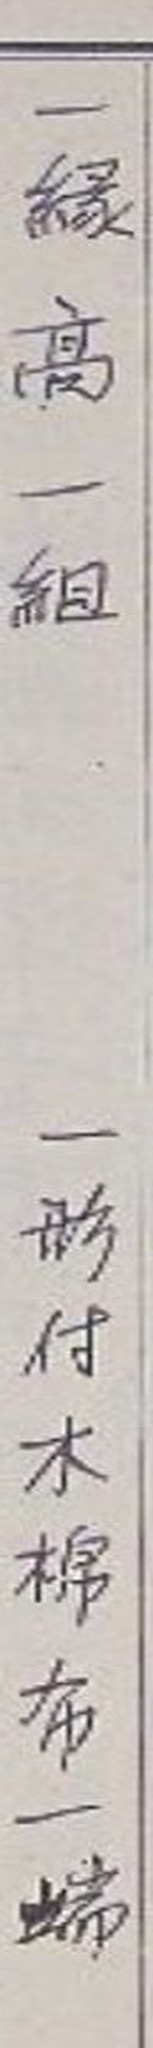一縁高一組一形付木棉布一端
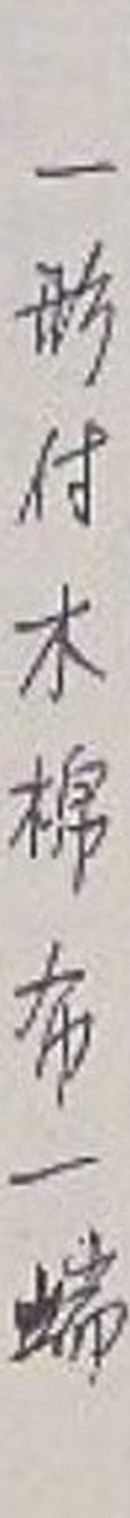一形付木棉布一端
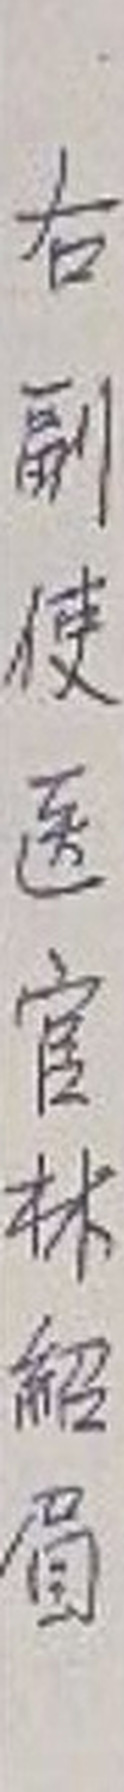右副使医官林紹眉
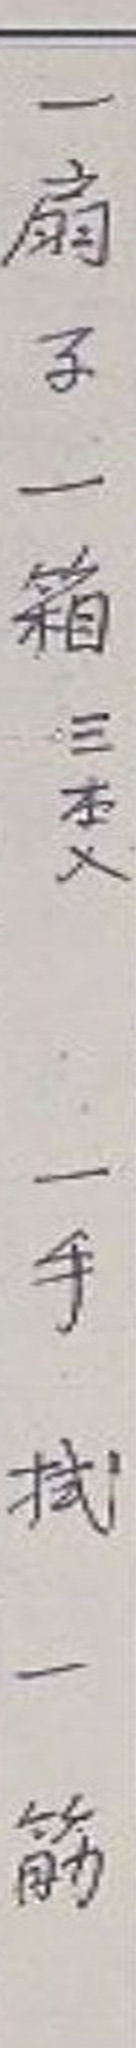一扇子一箱三本入一手拭一筋
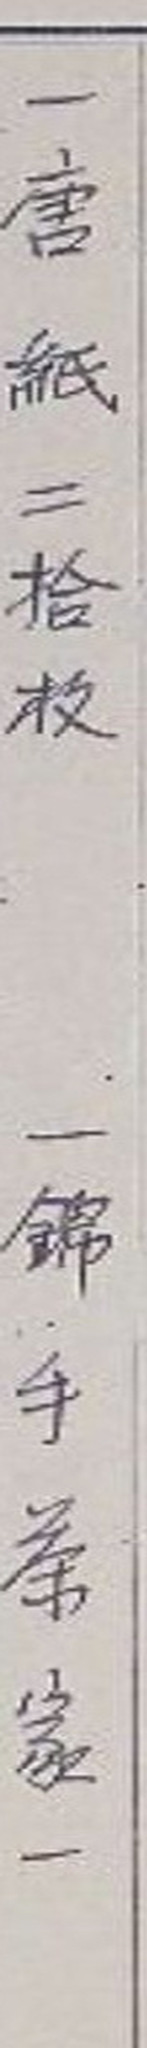一唐紙二拾枚一錦手茶家一
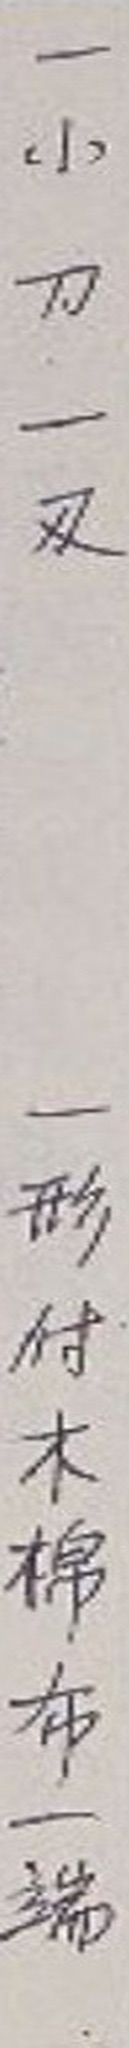一小刀一刃一形付木棉布一端
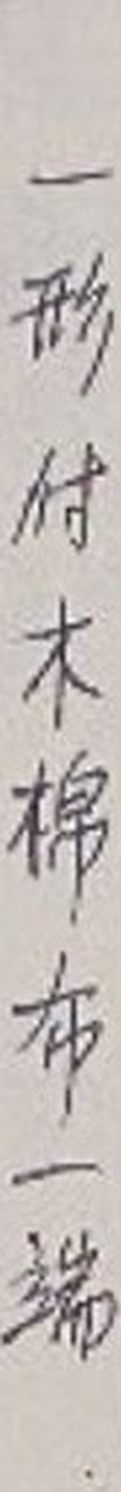一形付木棉布一端
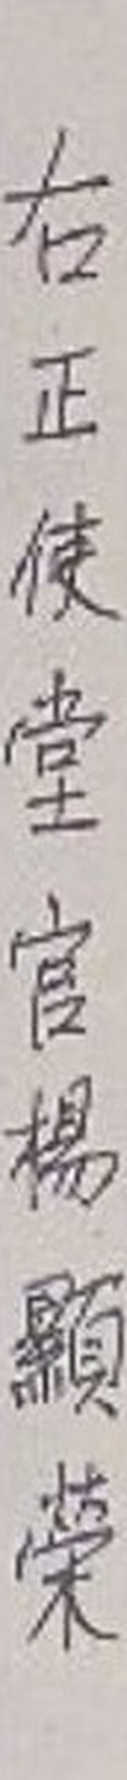右正使堂官楊顕栄
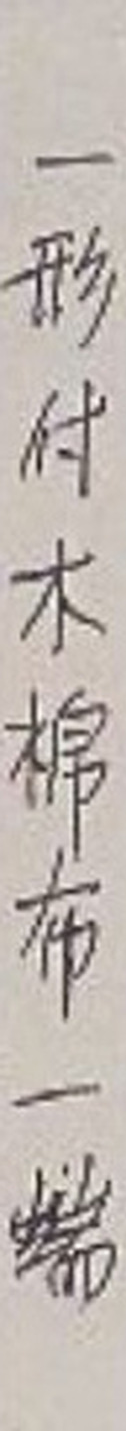一形付木棉布一端

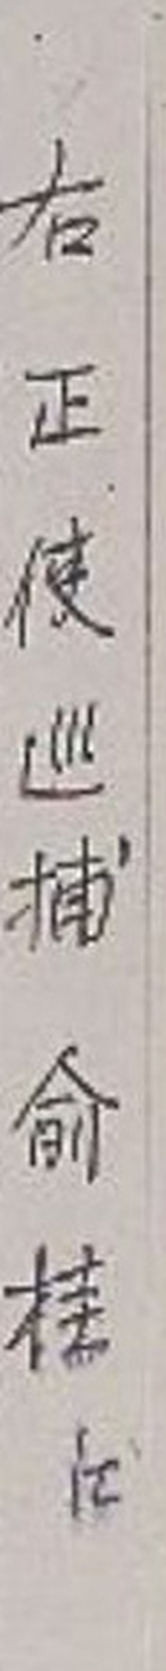右正使巡捕兪桂え
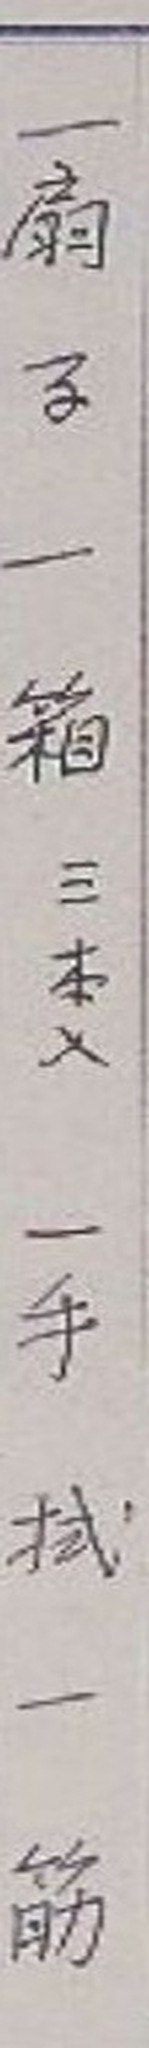一扇子一箱三本入一手拭一筋
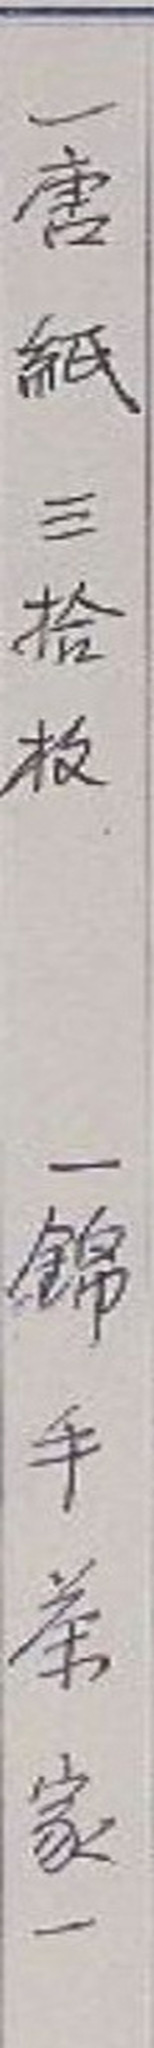一唐紙三拾枚一錦手茶家一
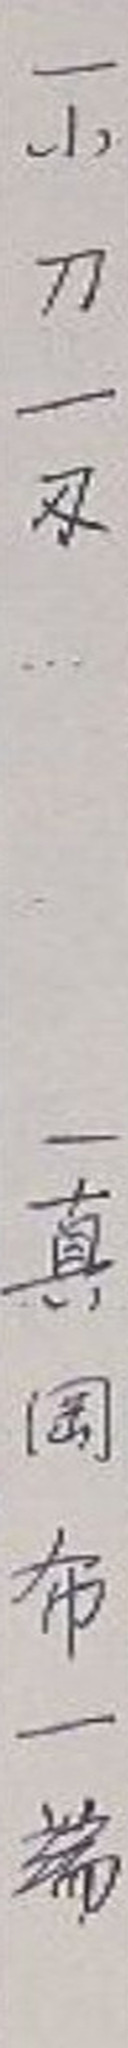一小刀一刃一真岡布一端
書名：支那冊封使来琉諸記 下巻
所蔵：University of the Ryukyus Library
